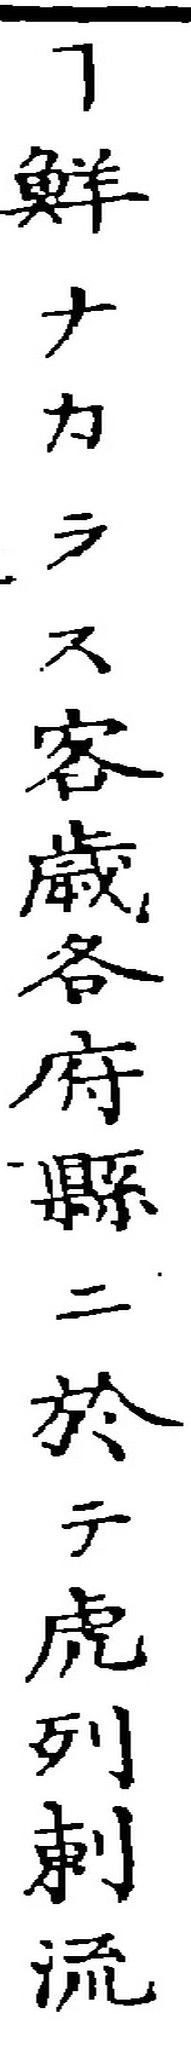ヿ鮮ナカラス客歳各府縣ニ於テ虎列刺流
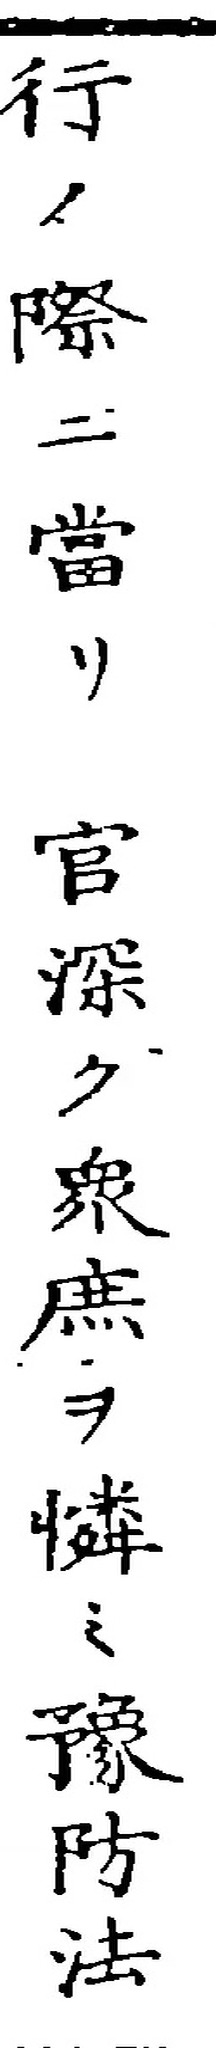行ノ際ニ當リ官深ク衆庶ヲ憐ミ豫防法
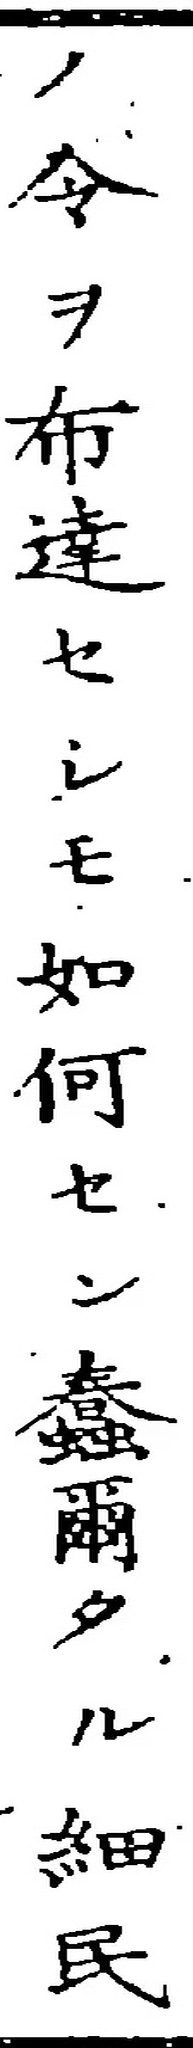ノ令ヲ布達セシモ如何セン蠢爾タル細民
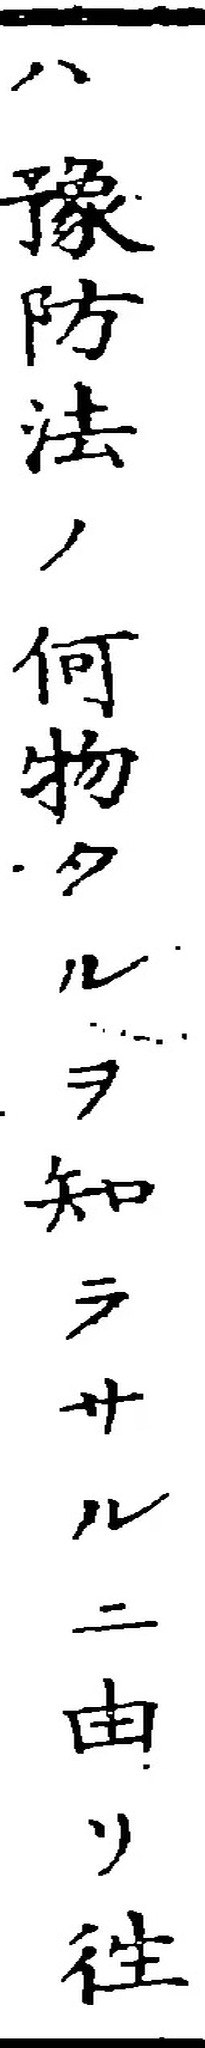ハ豫防法ノ何者タルヲ知ラサルニ由リ往
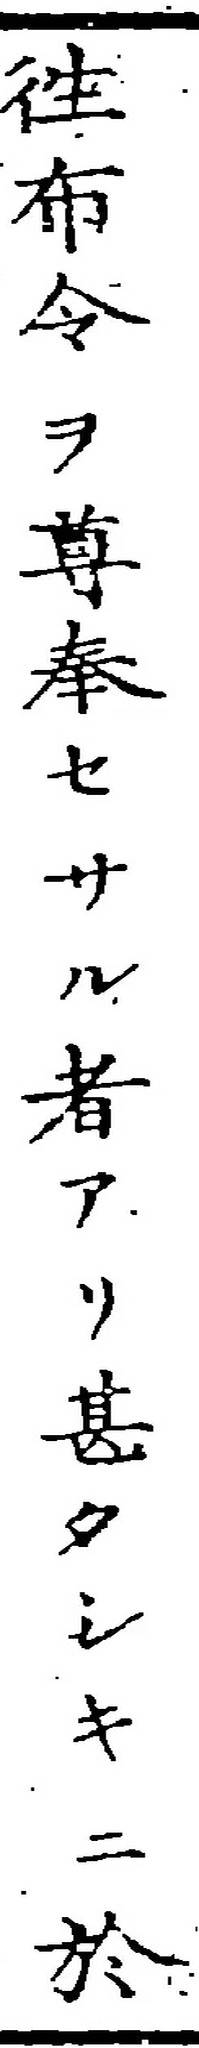往布令ヲ尊奉セサル者アリ甚タシキニ於
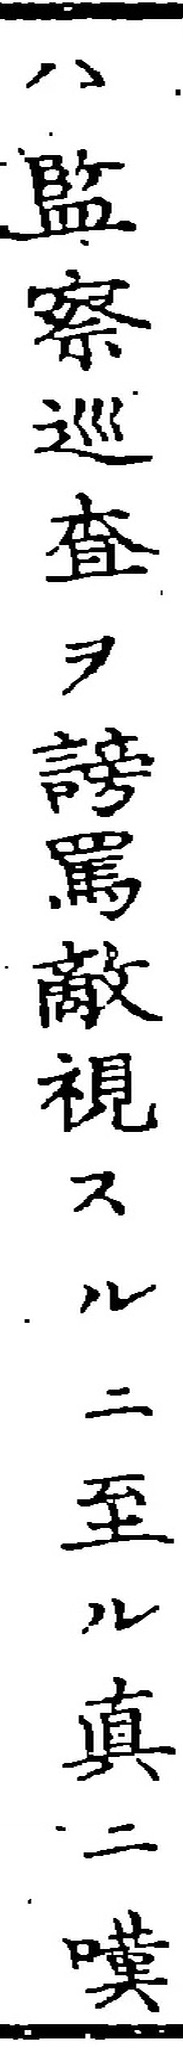は監察巡査ヲ謗罵敵視スルニ至ル真ニ嘆
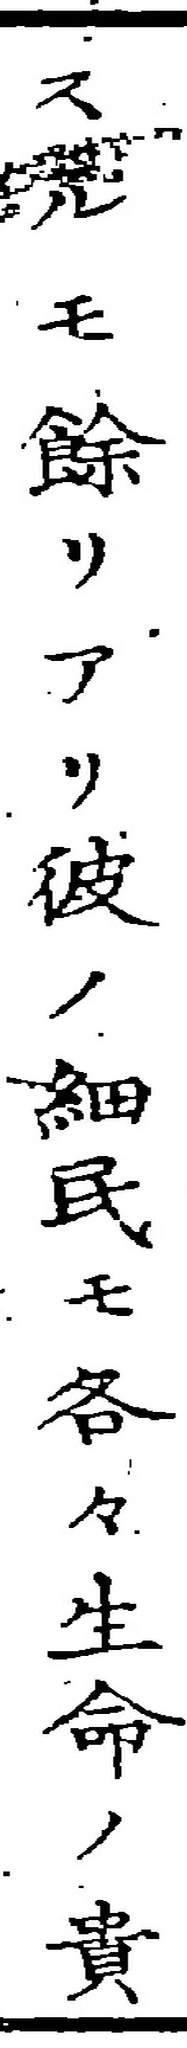スルモ餘リアリ彼ノ細民モ各々生命ノ貴
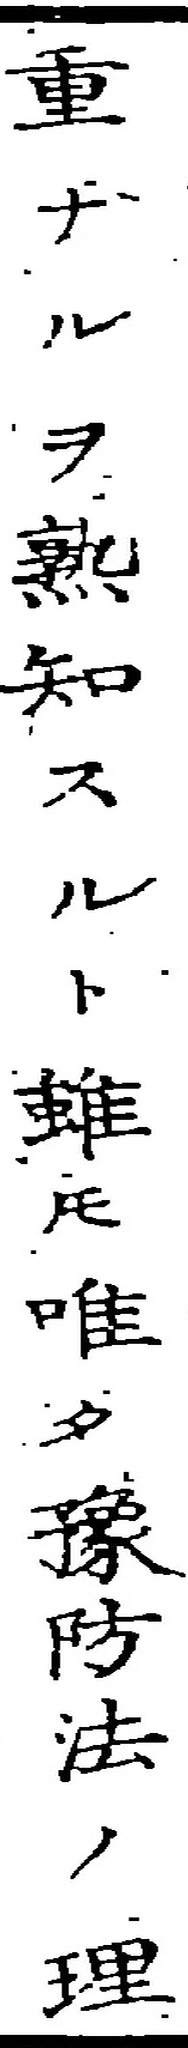重ナルヲ熟知スルト雖𪜈唯タ豫防法ノ理
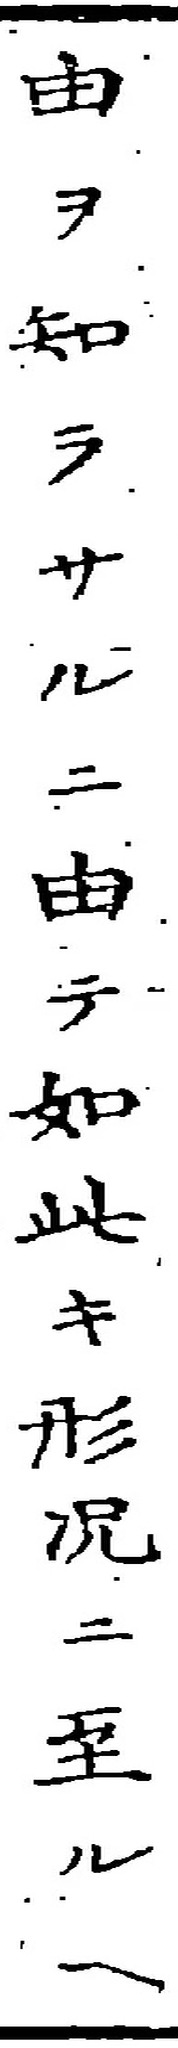由ヲ知ラサルニ由テ如此キ形况ニ至ルヘ
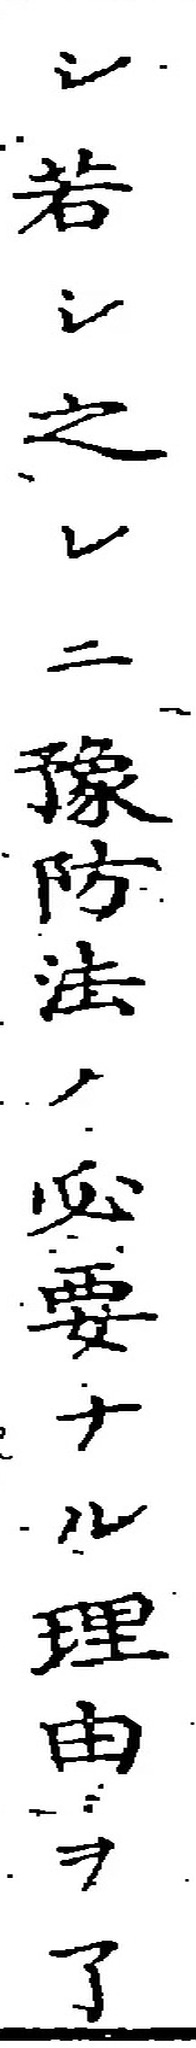シ若シ之レニ豫防法ノ必要ナル理由ヲ了
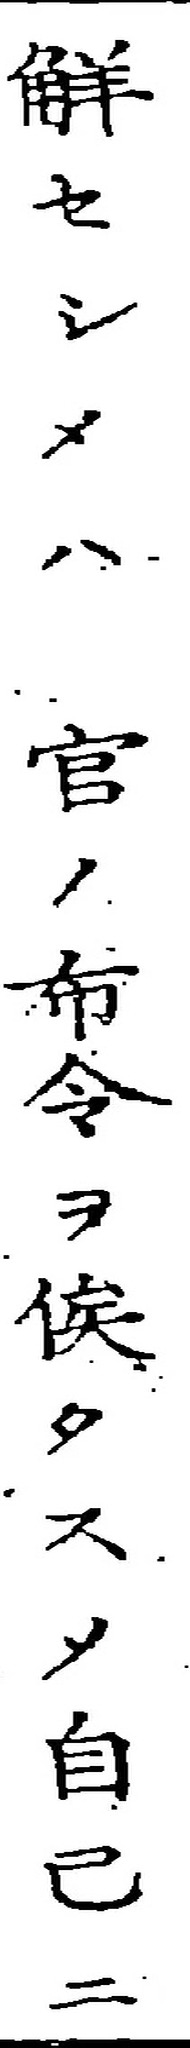觧セシメハ官ノ布令を俟タス𬼀自己ニ
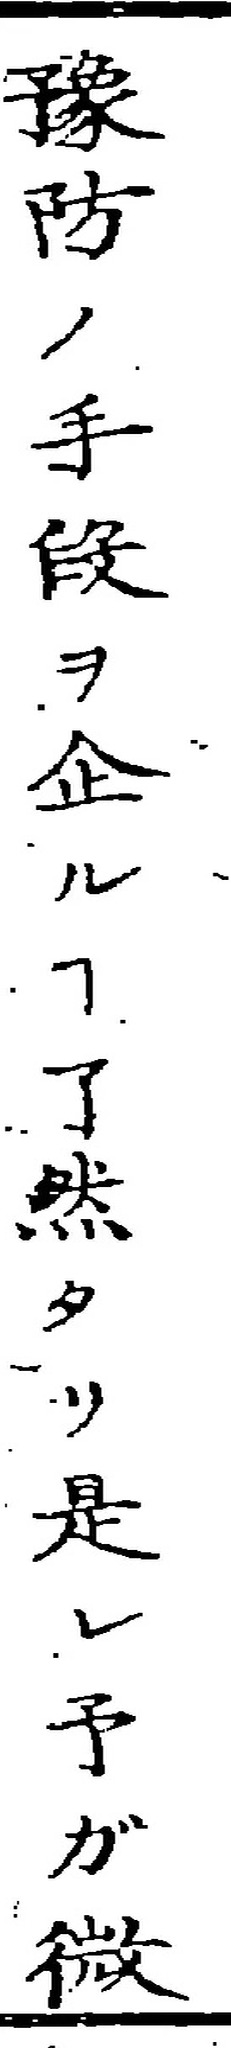豫防ノ手段ヲ企ルヿ了然タリ是レ予ガ微
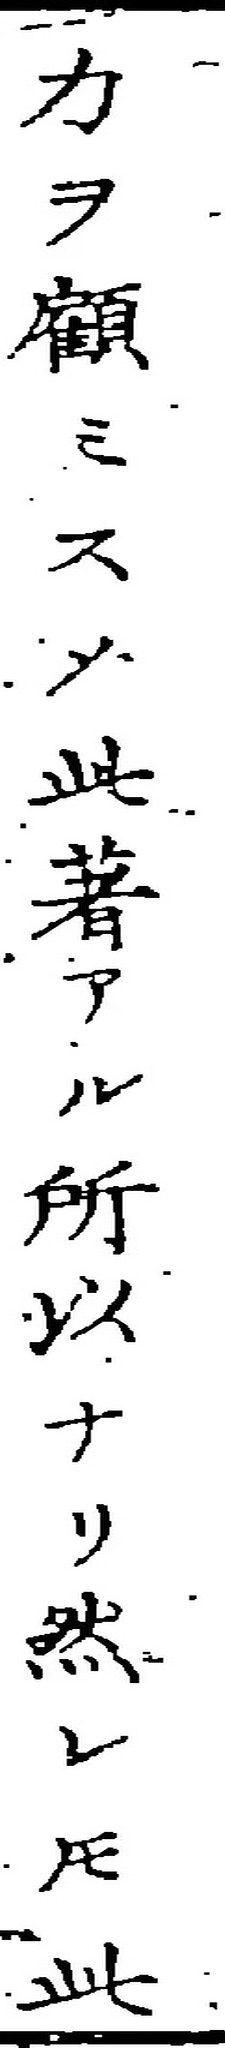力ヲ顧ミス𬼀此著アル所以ナリ然レ𪜈此
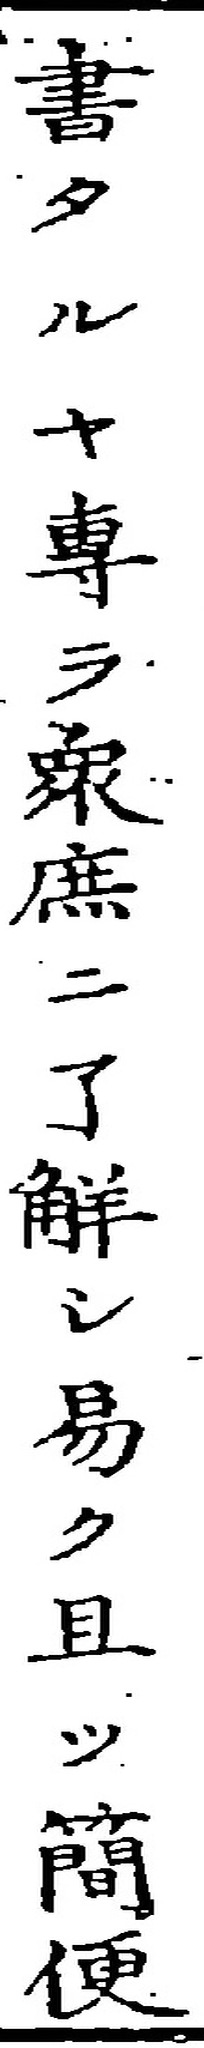書タルヤ専ラ衆庶ニ了觧シ易ク且ツ簡便
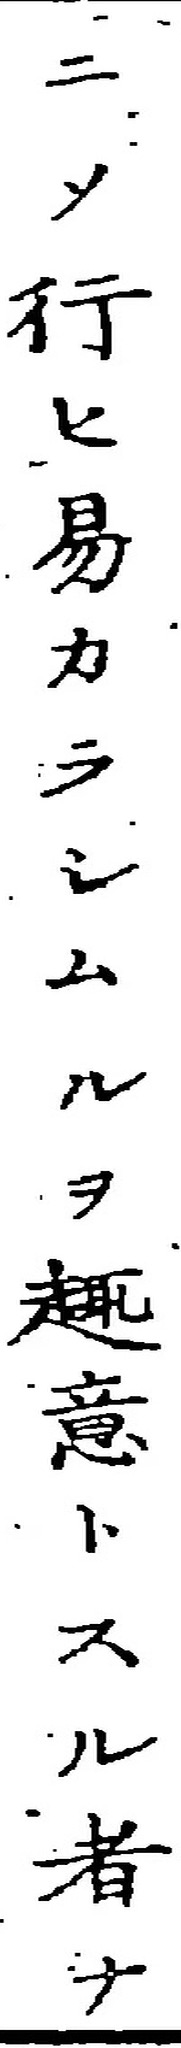ニ𬼀行ヒ易カラシムルヲ趣意トスル者ナ
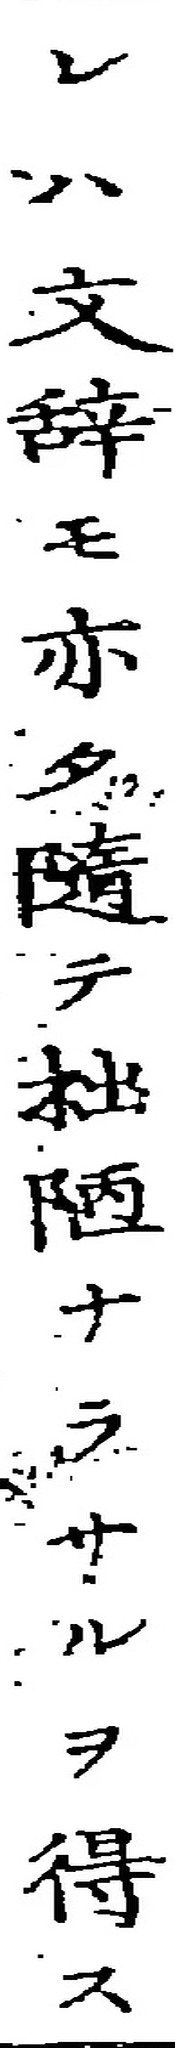レハ文辞モ亦タ隨テ拙陋ナラサルヲ得ス
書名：コレラ予防命乃後見
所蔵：国立国会図書館 National Diet Library, JAPAN
